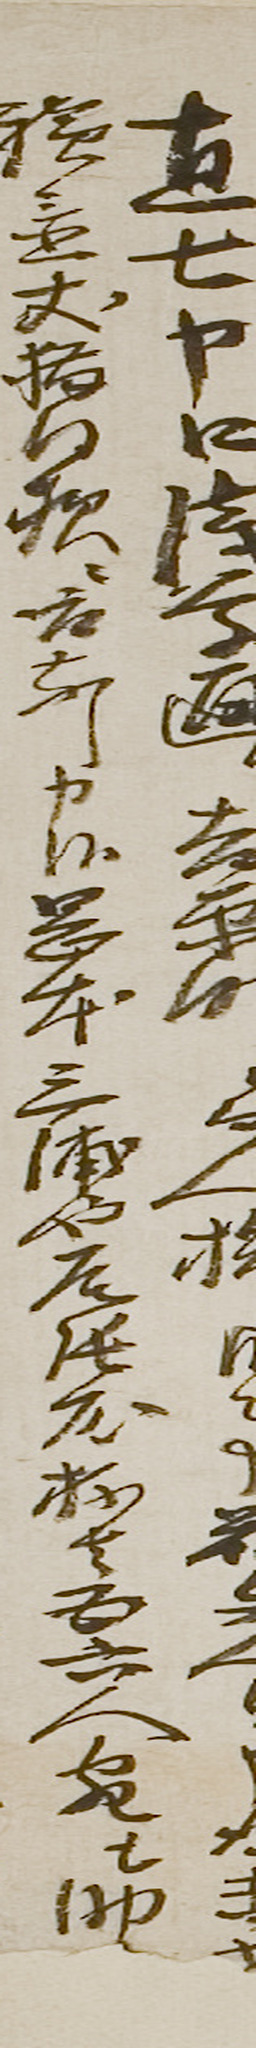積置丈猫同様に取なし申候岡本三浦や尾張屋抔は五六人宛も助の
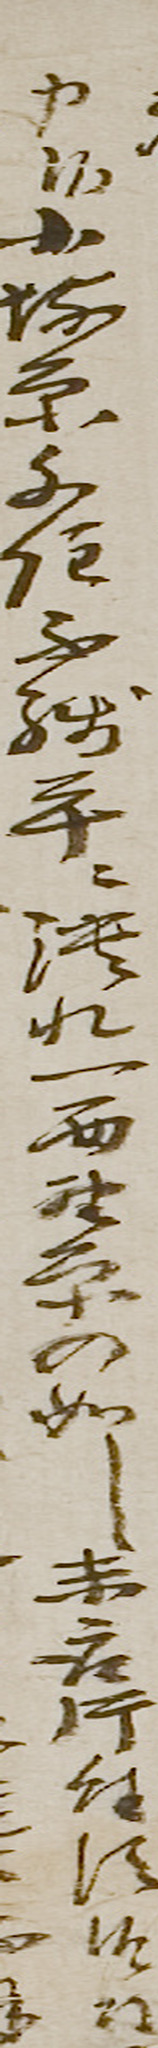申候小塚原千住不残平に潰れ一面野原の如し未取片付す候得共行
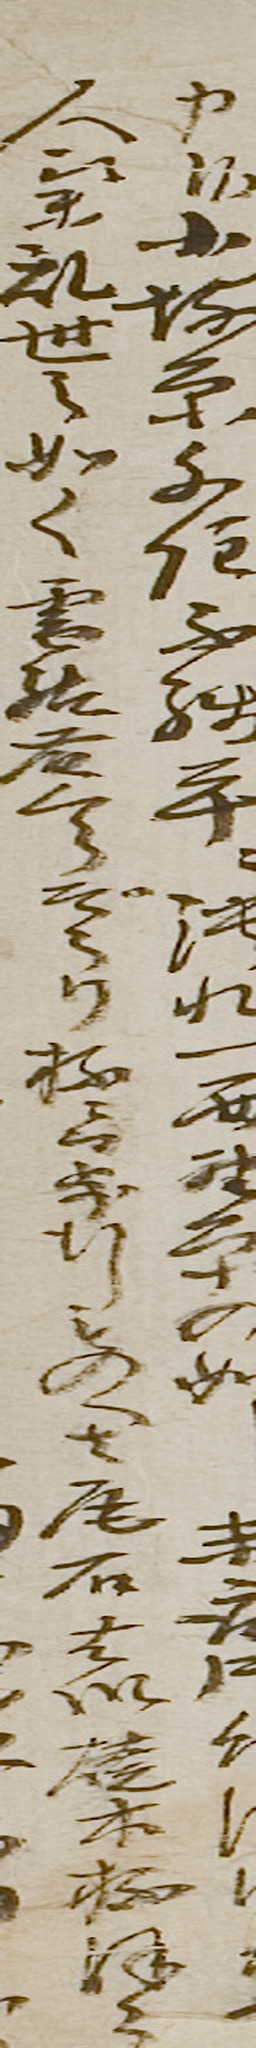人気乱世之如く雪駄藤くらぞうり抔にて歩行ものへは瓦石はい焼木抔ほ物も
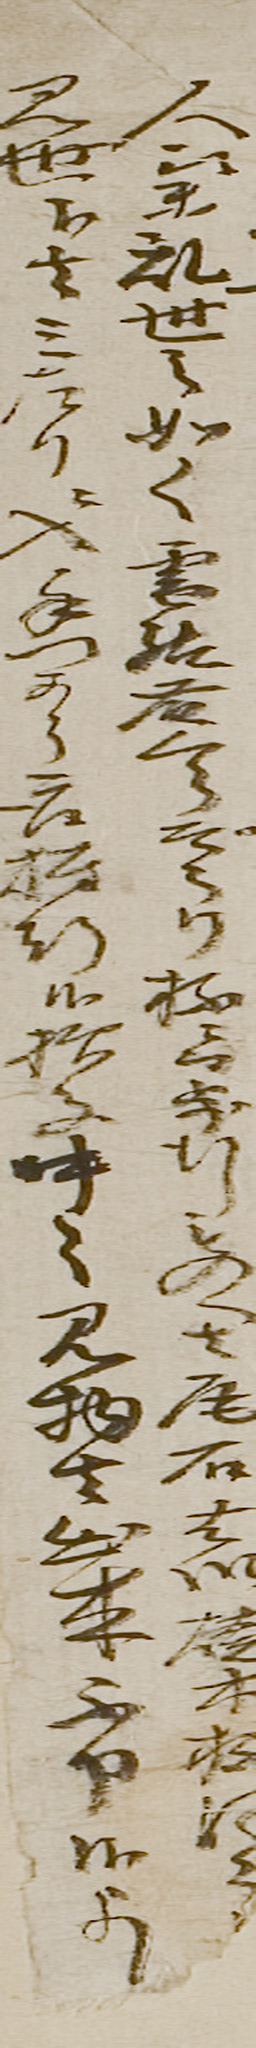見世えはみたりに入手つから取持行候様子中々見物は出来不申候よし
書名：[江戸大地震]
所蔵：東京大学総合図書館 General Library in the University of Tokyo, JAPAN
